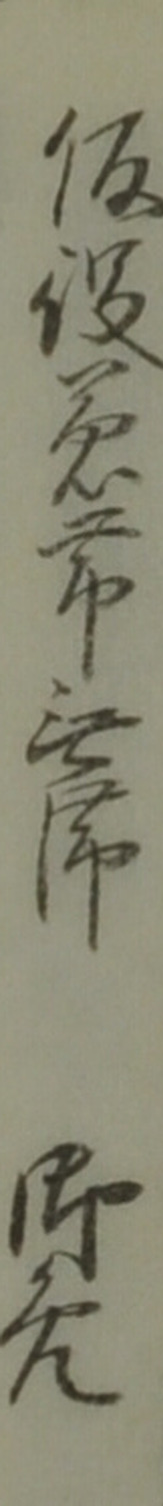仮役兼帯無滞御免
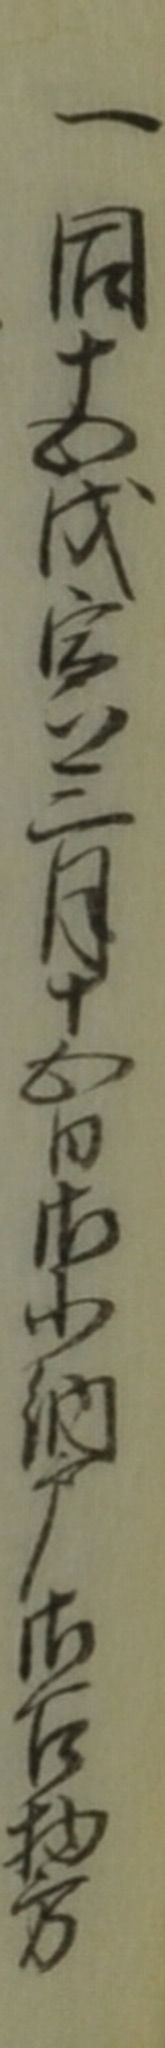一同十五戊寅三月十五日御小納戸御召物方
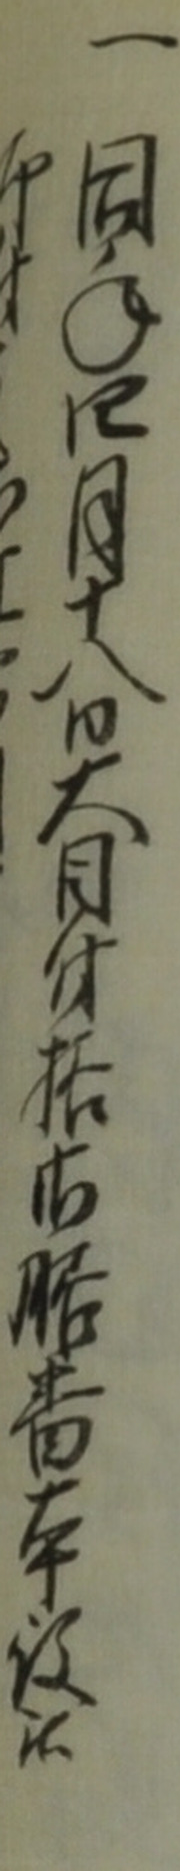一同年四月十八日大目付格御膳番本役被
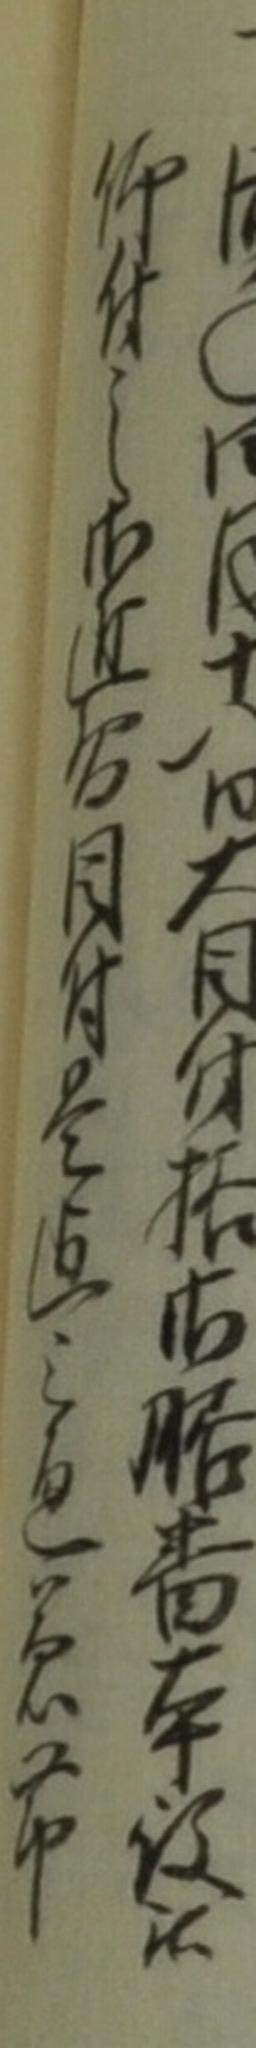仰付之御近習目付是迄之通兼帯
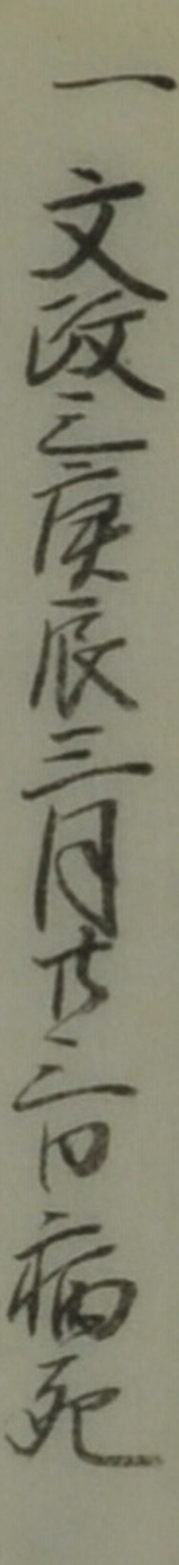一文政三庚辰三月廿三日病死
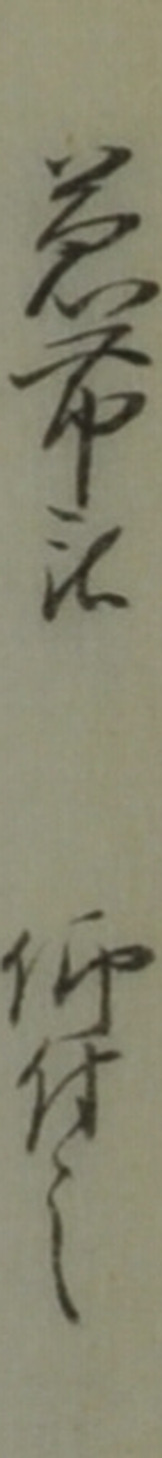兼帯被仰付之
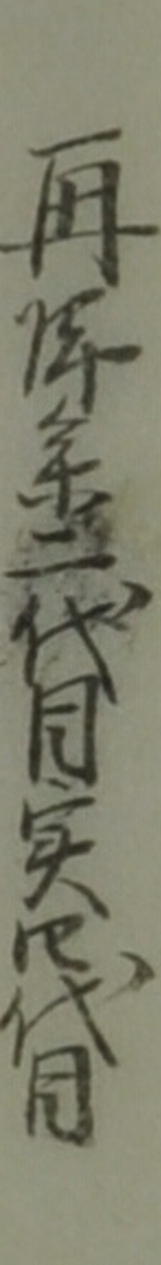再帰参二代目実四代目
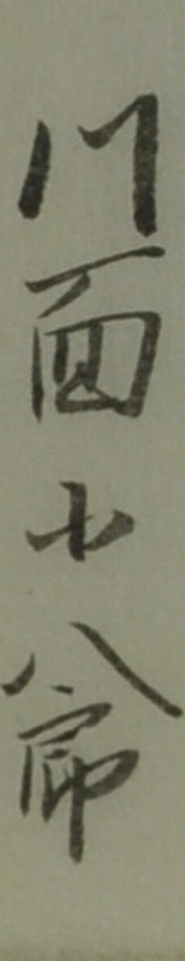川面小八郎
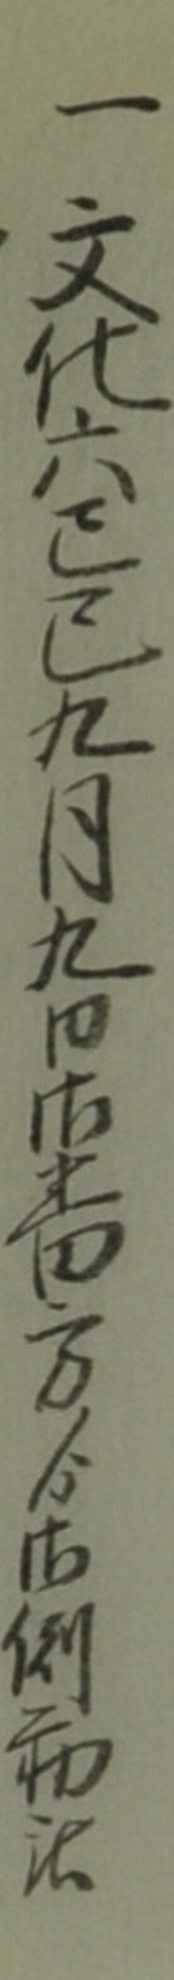一文化六己巳九月九日御番方ゟ御側勤被
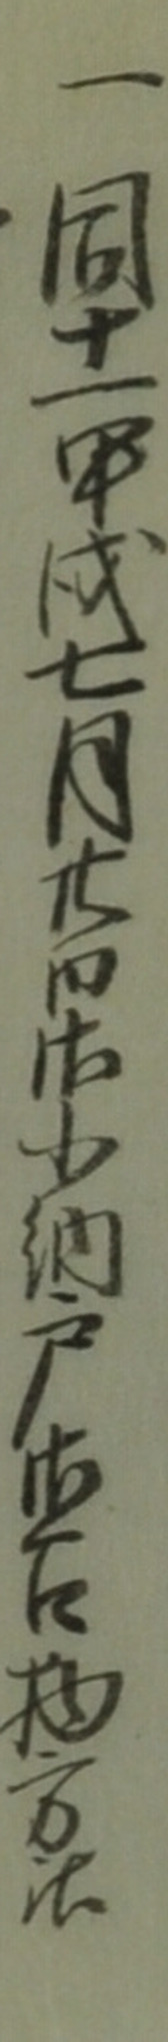一同十一甲戌七月廿日御小納戸御召物方被
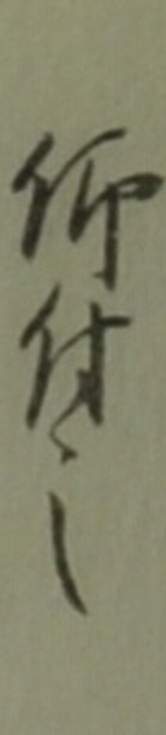仰付之
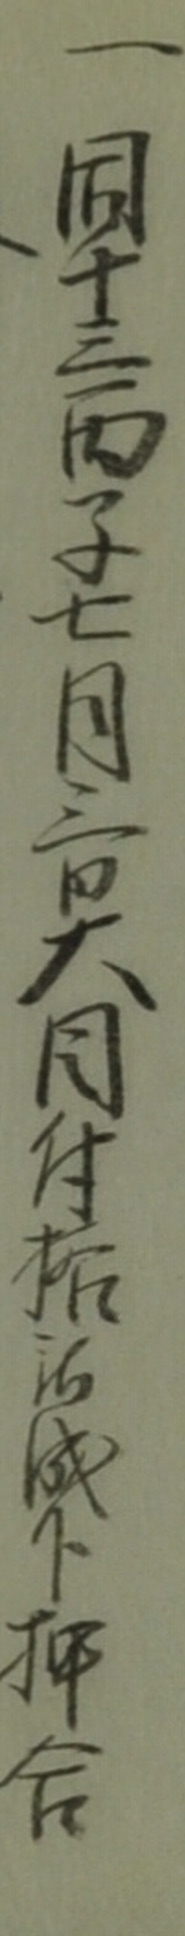一同十三丙子七月三日大目付格被成下押合
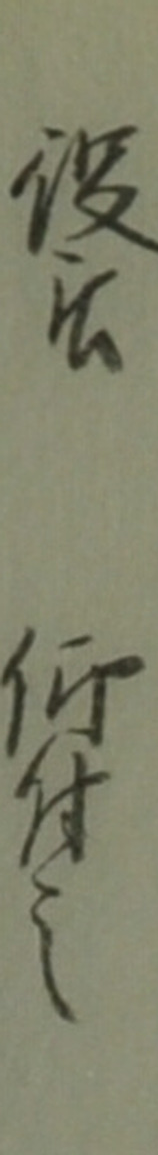役被仰付之
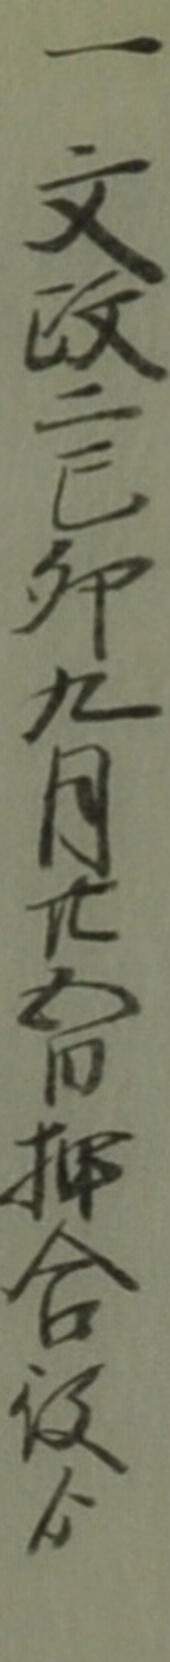一文政二己卯九月廿五日押合ゟ
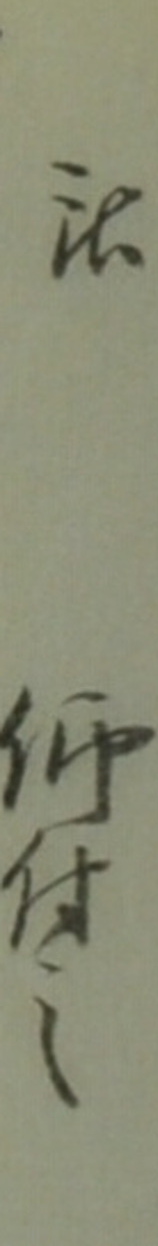役被仰付之
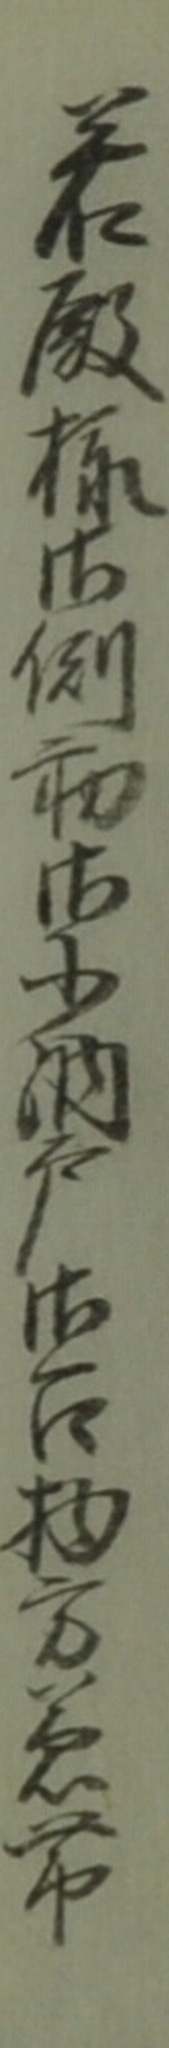若殿様御側勤御小納戸御召物方兼帯
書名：諸御役代々録（五）
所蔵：伊那市立高遠町図書館・合同会社AMANE
